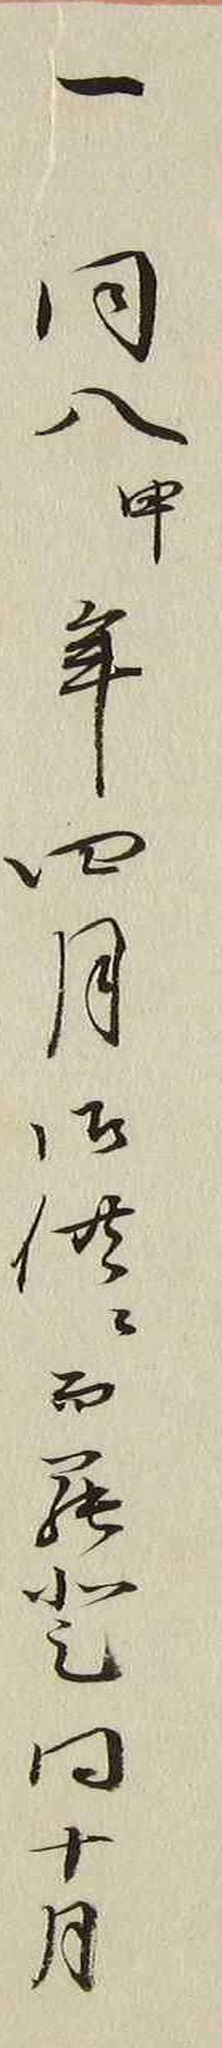一同八申年四月御供ニ而罷登同十月
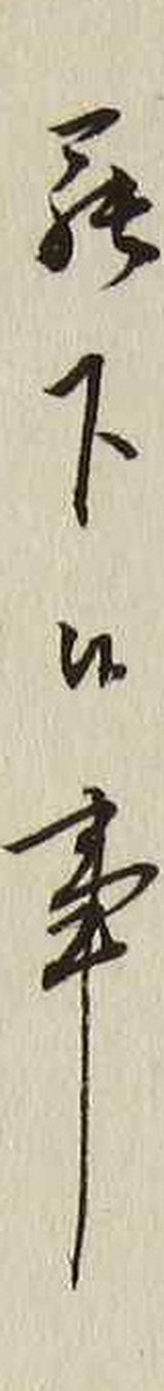罷下候事
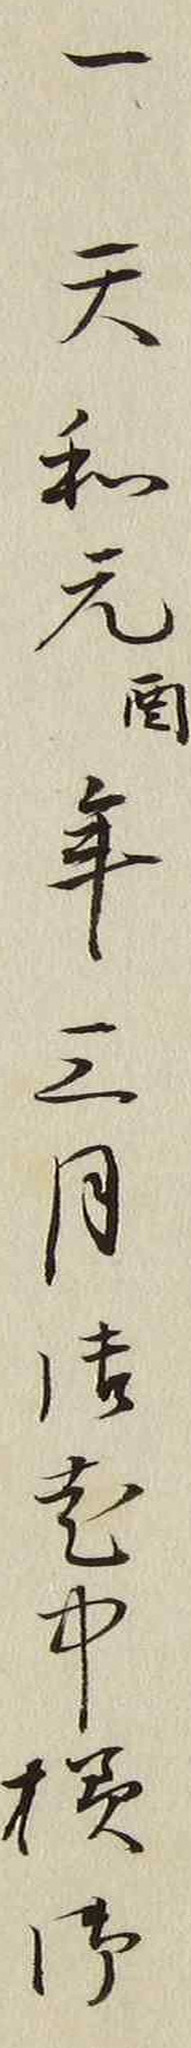一天和元酉年三月御老中様御
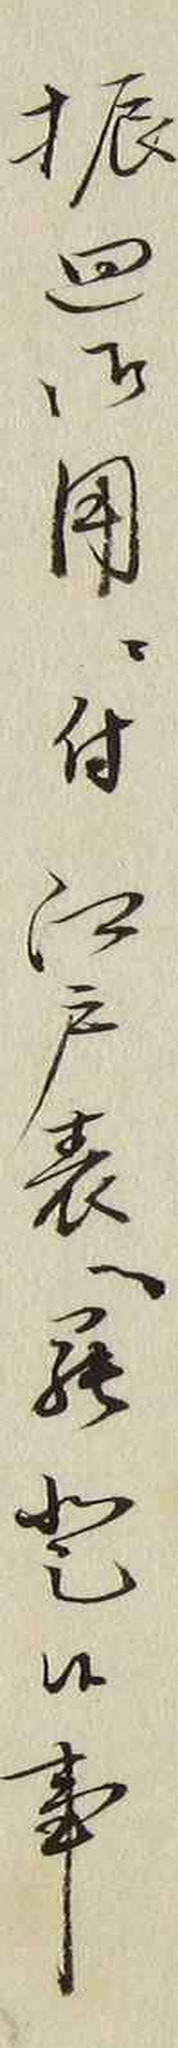振廻御用ニ付江戸表へ罷登候事
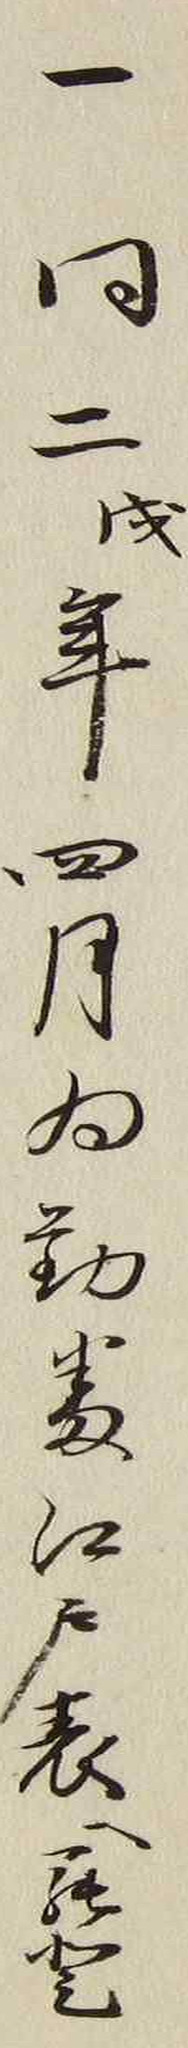一同二戌年四月為勤番江戸表へ罷登
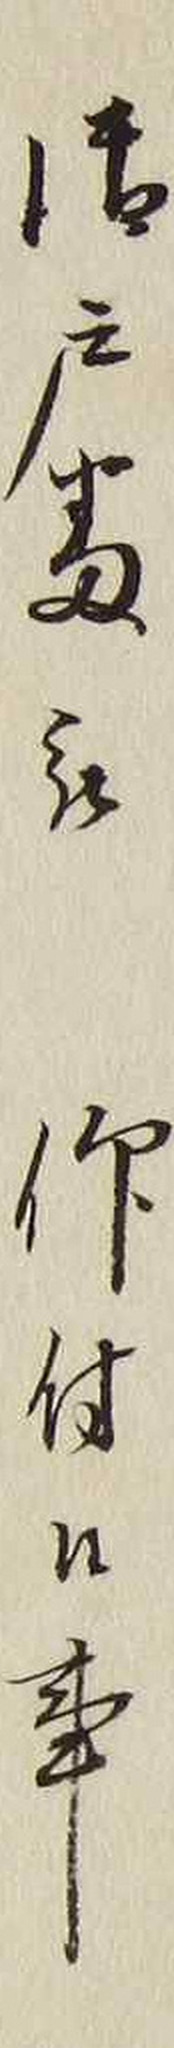御戸番被仰付候事
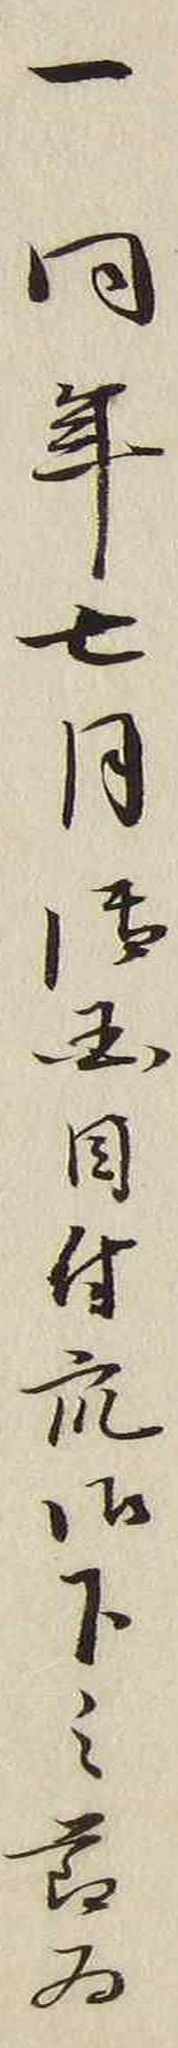一同年七月御国目付衆御下之節為

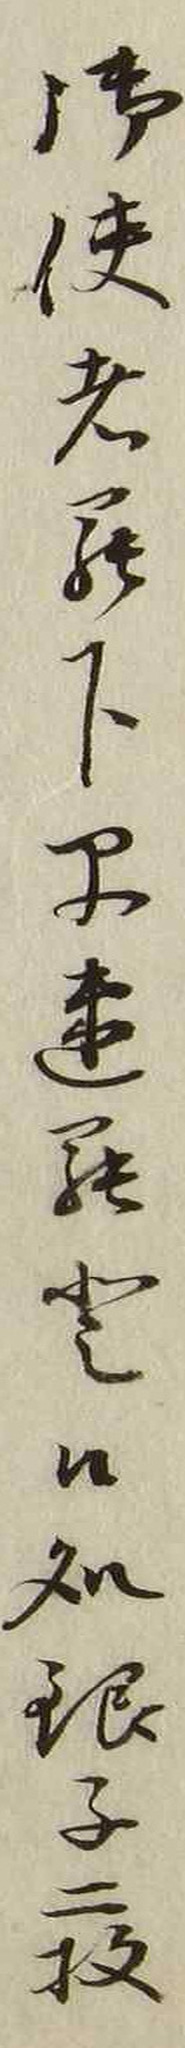御使者罷下早速罷登候処銀子二枚
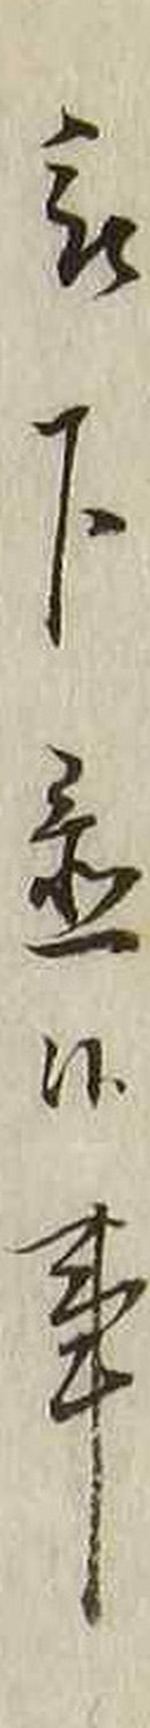被下置候事
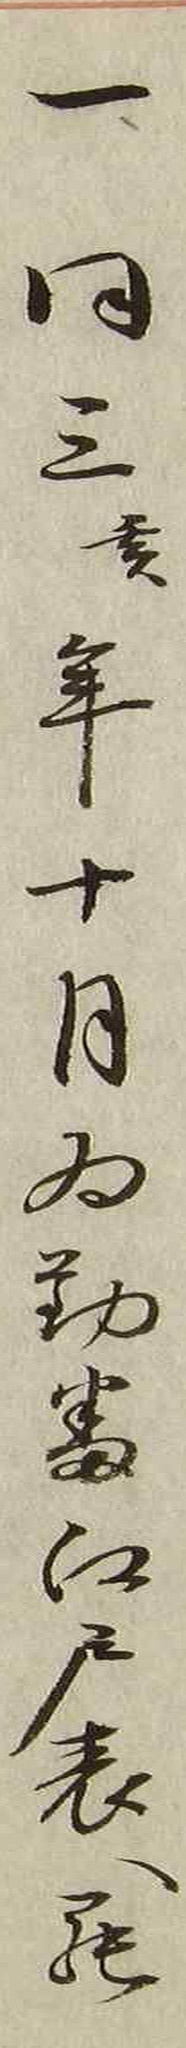一同三亥年十月為勤番江戸表へ罷
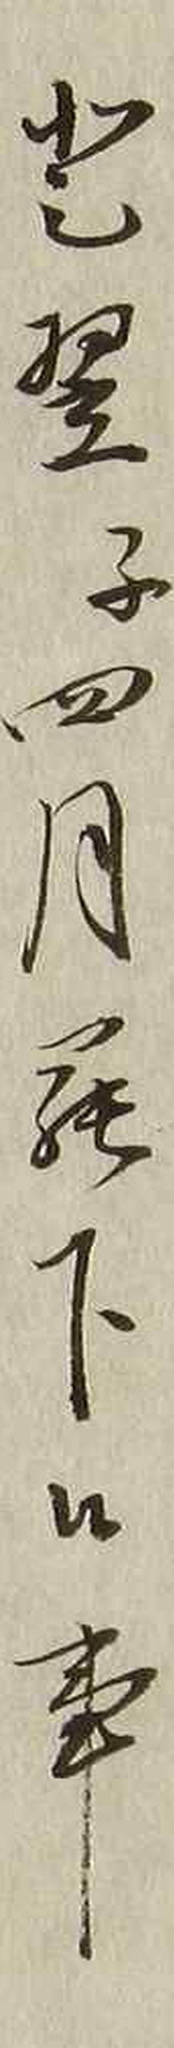登翌子四月罷下候事
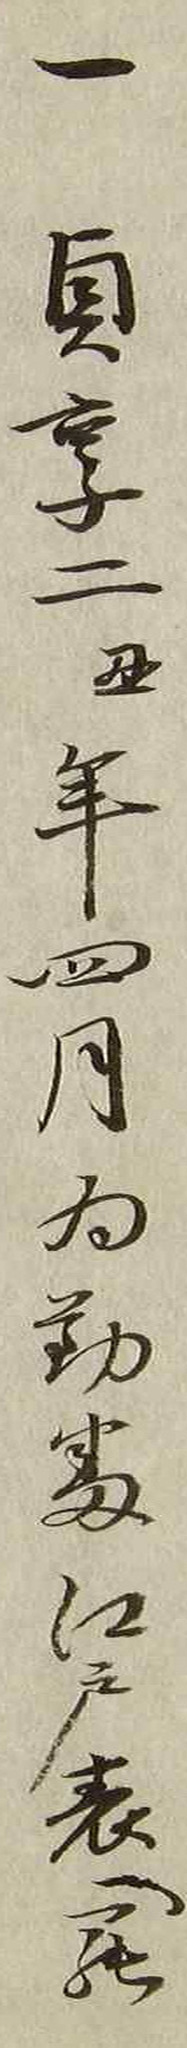一貞享二丑年四月為勤番江戸表へ罷
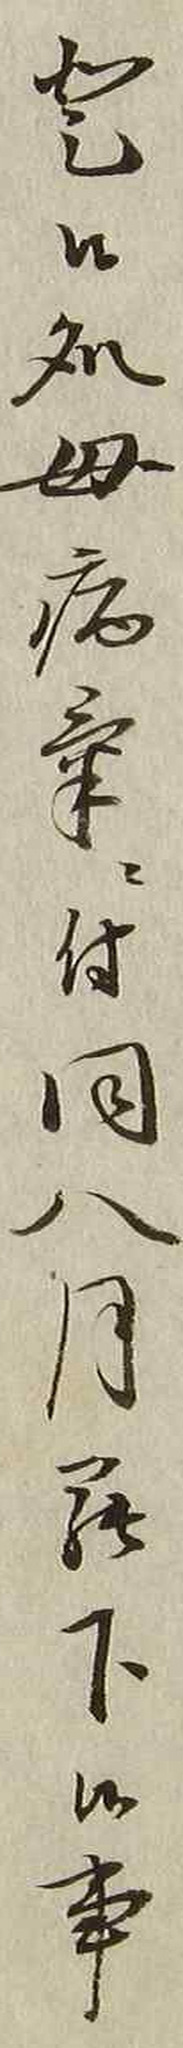登候処母病気ニ付同八月罷下候事
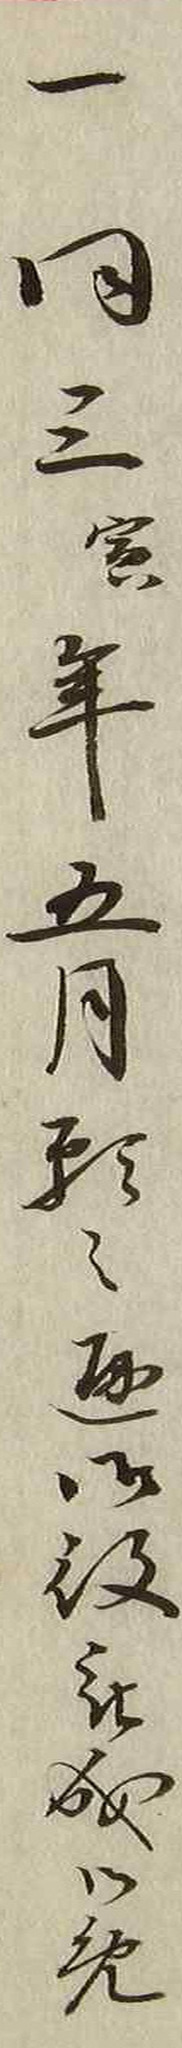一同三寅年五月願之通御御役被成御免
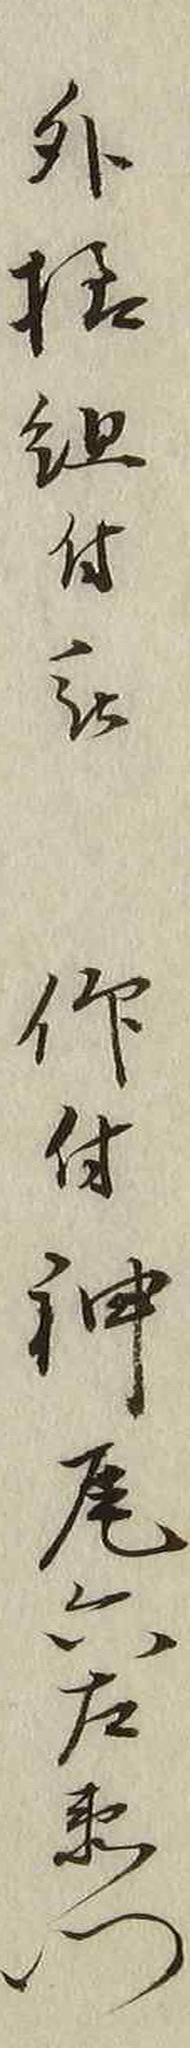外様組付被仰付神尾六左衛門
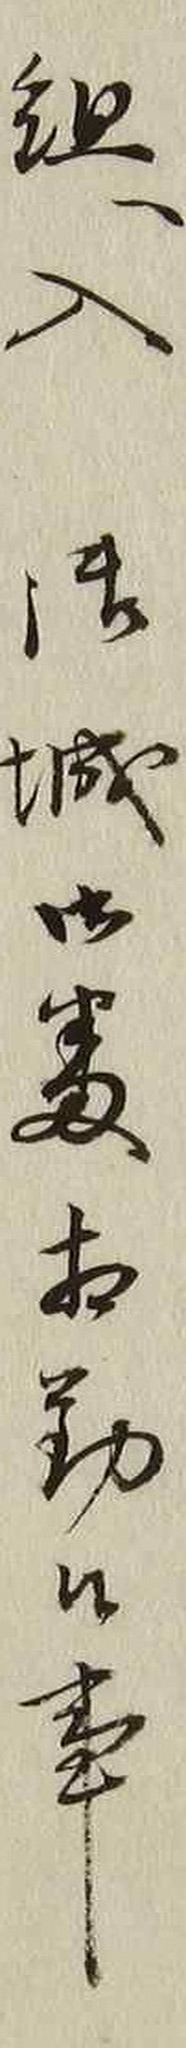組へ入御城御番相勤候事
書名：諸士系譜　巻之22　い之部22
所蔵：会津若松市立会津図書館
